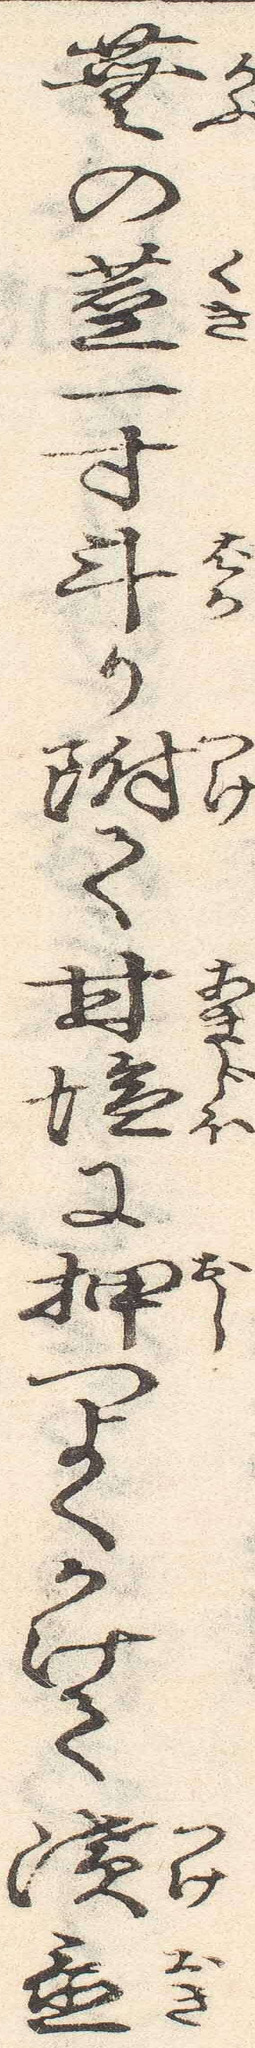蕪の茎一寸斗り附て甘塩に押つよくかけて漬置
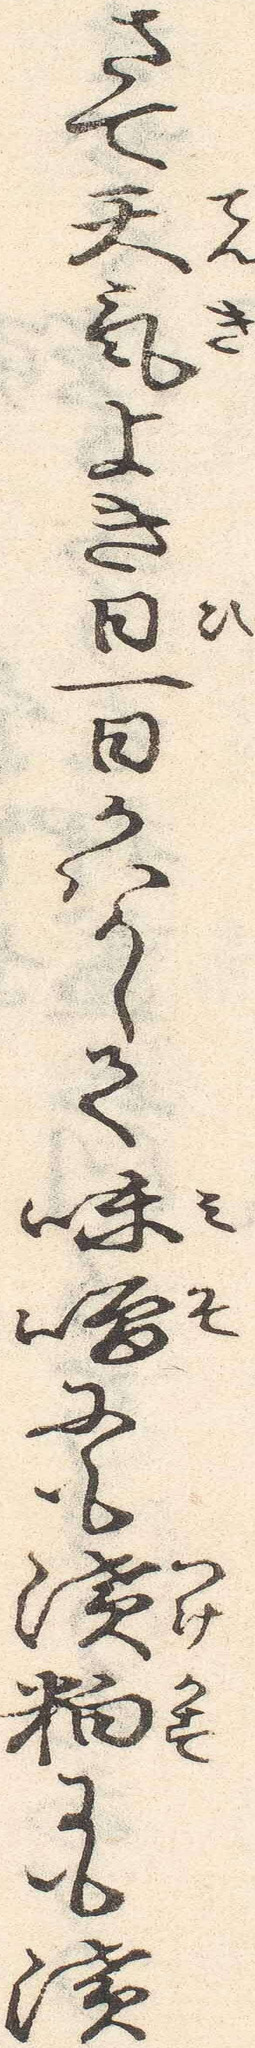さて天気よき日一日かはかして味噌にも漬粕にも漬
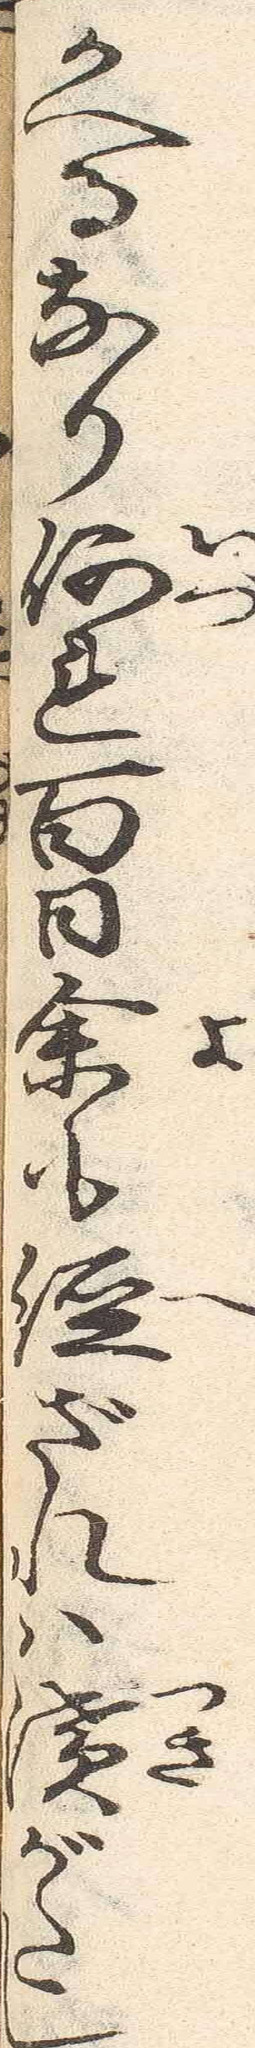かへるなり何れ百日余も経ざれは漬がたし
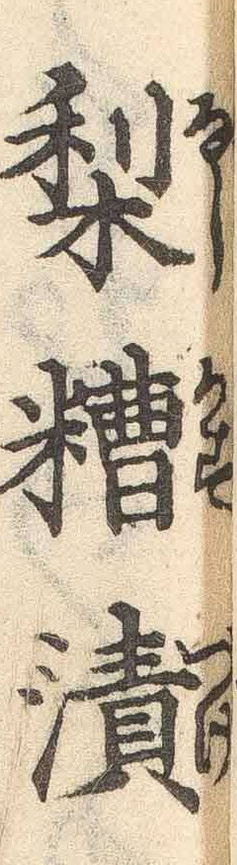梨糟漬
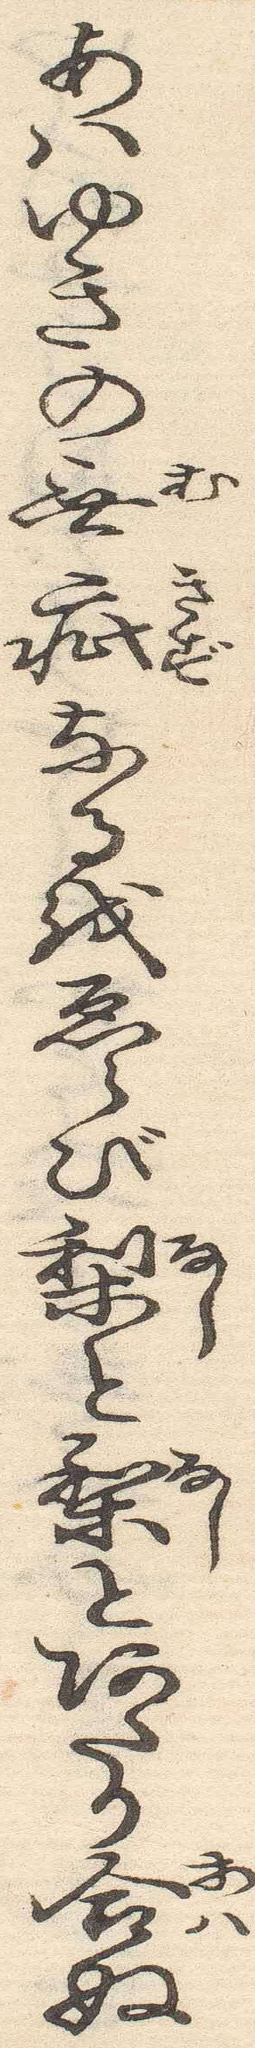あはゆきの無疵なるをゑらび梨と梨とあたり合ぬ
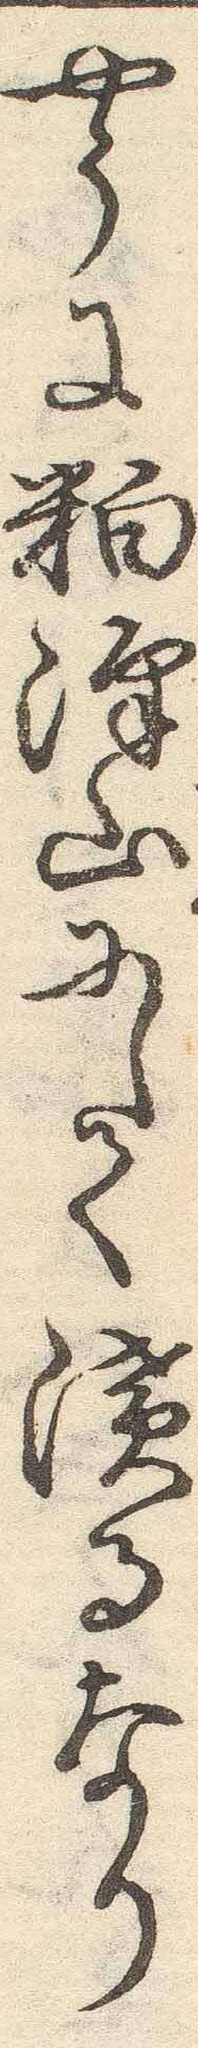やうに粕沢山にして漬るなり
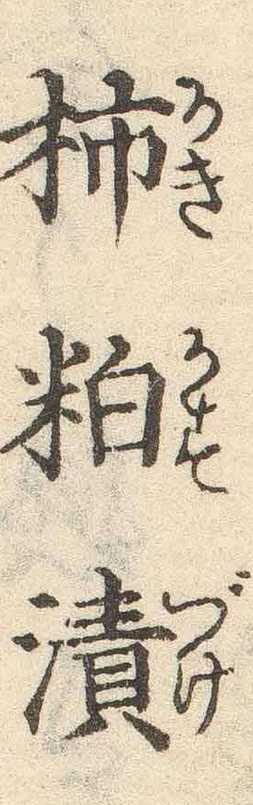柿粕漬
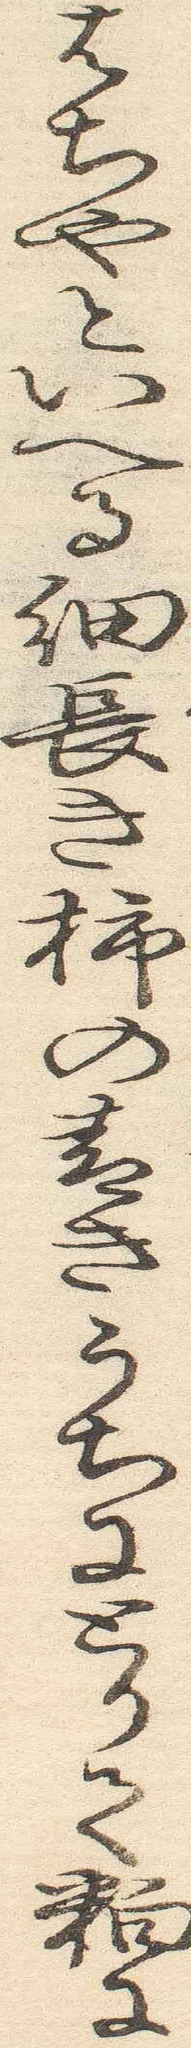はちやといへる細長き柿の青きうちにとりて粕に
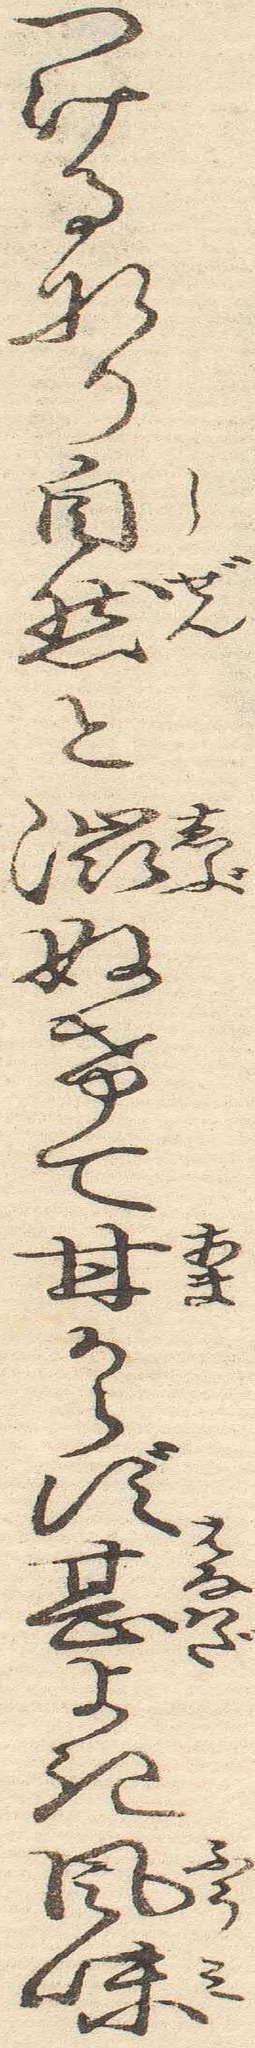つけるなり自然と渋ぬけて甘からず甚よき風味
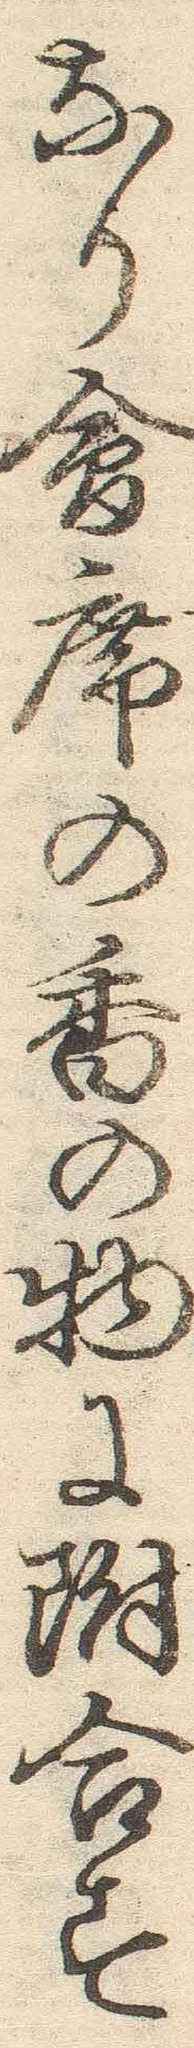なり会席の香の物に附合す
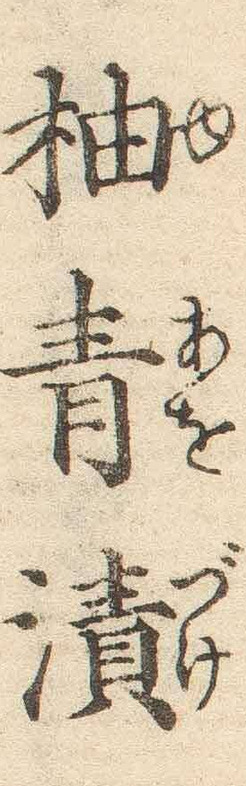柚青漬
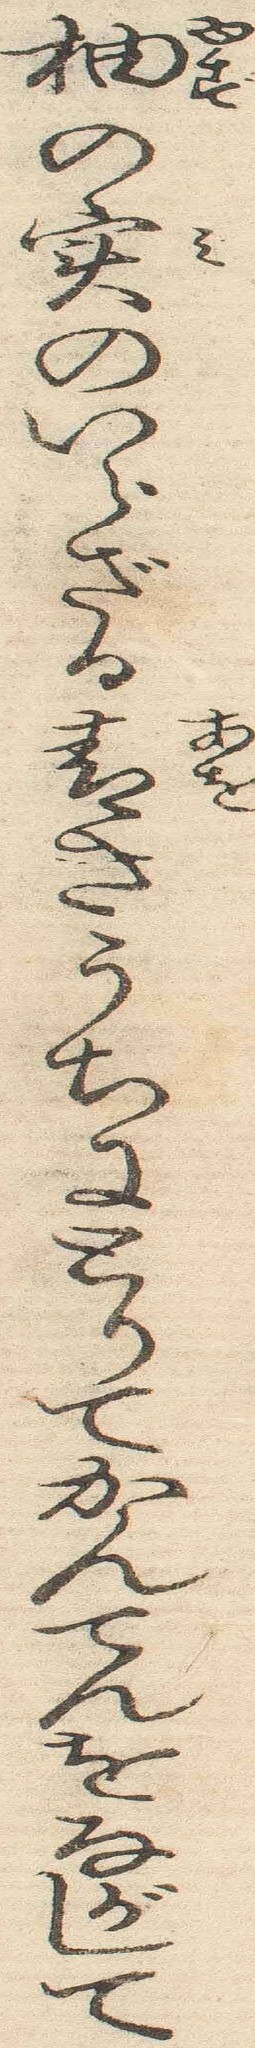柚の実のいらざる青きうちにとりてかんてんをながして

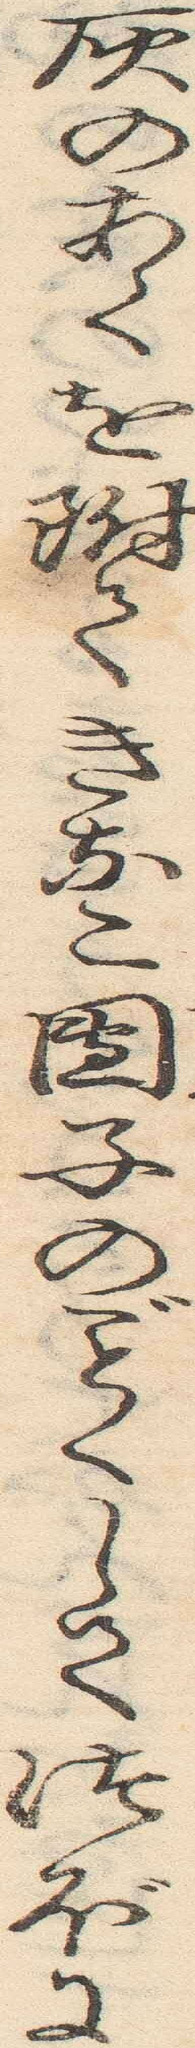灰のあくを附てきなこ団子のごとくしてつぼに
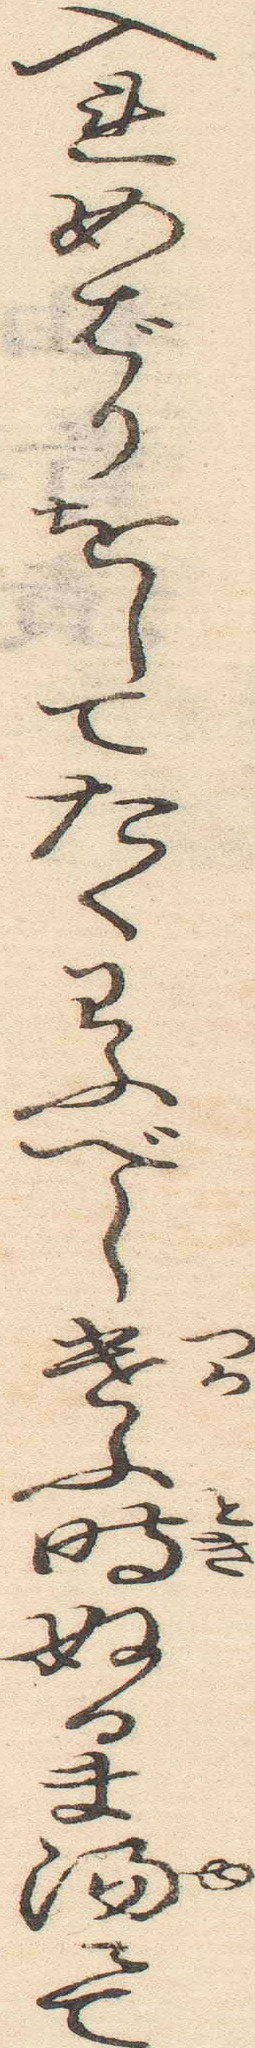入れめばりをしてたくわふべし遣ふ時ぬるま湯にて
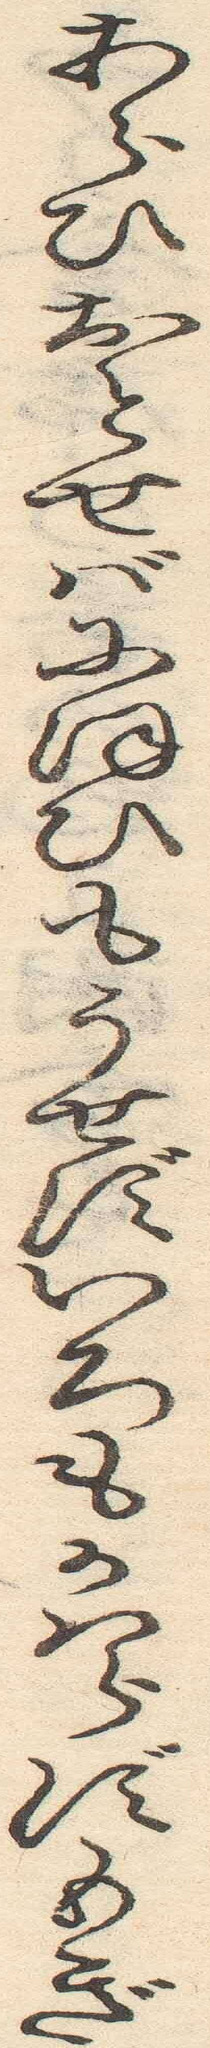あらひおとせばにほひもうぜずいろもかはらずもぎ
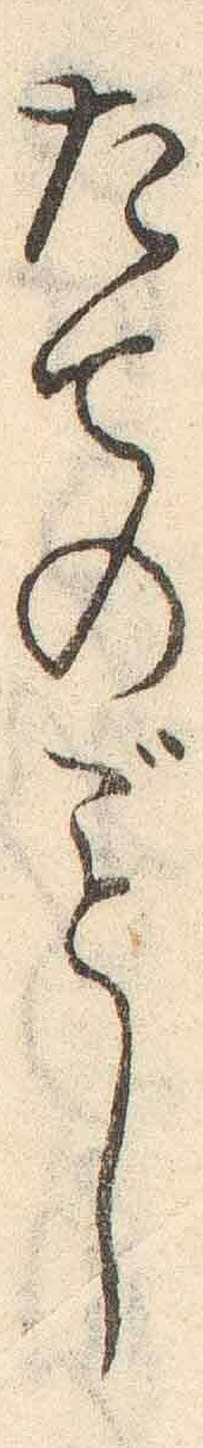たてのごとし
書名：四季漬物塩嘉言
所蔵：東京学芸大学附属図書館 国文学研究資料館
